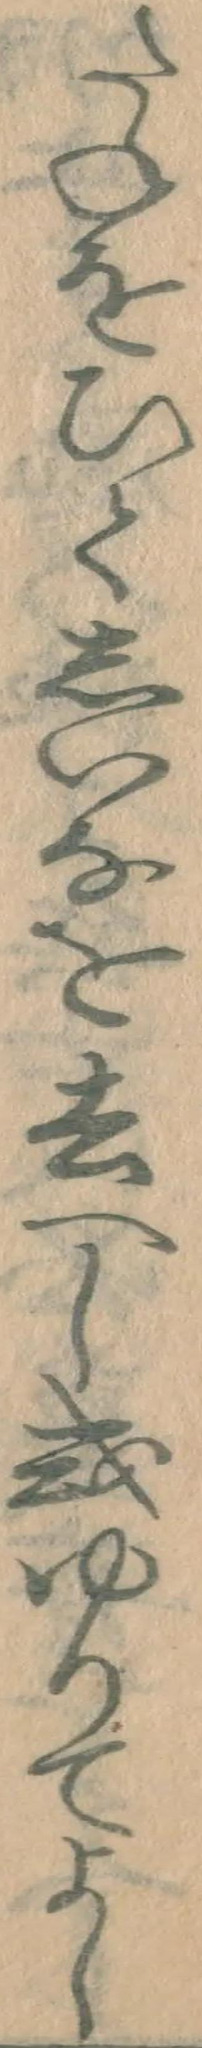たねをひてしいなを去へし或ゆりてよし
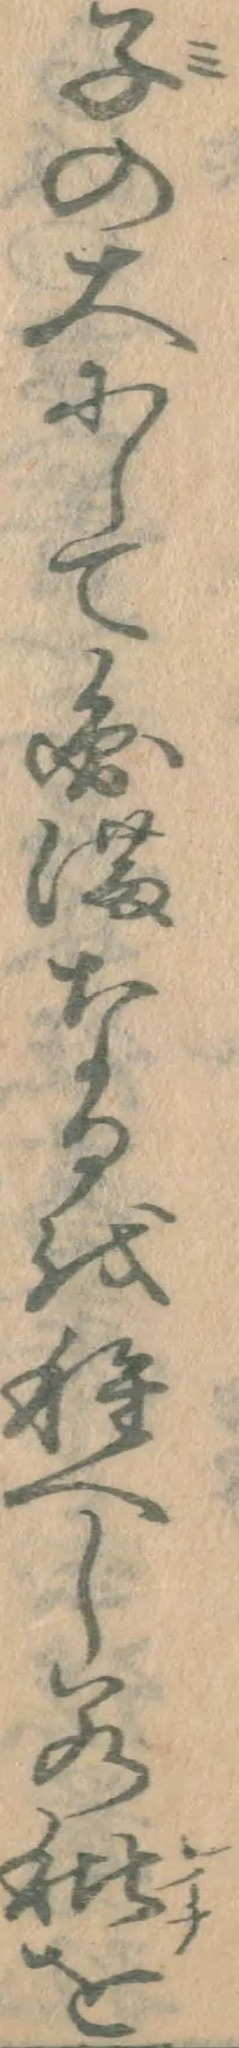子の大にして円満なるを種へし若秕を
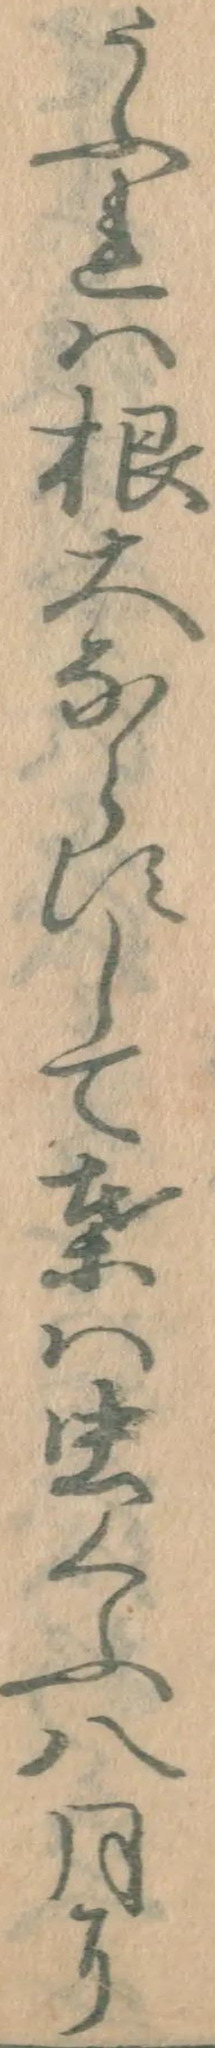うふれは根大ならすして葉は虫くふ八月に
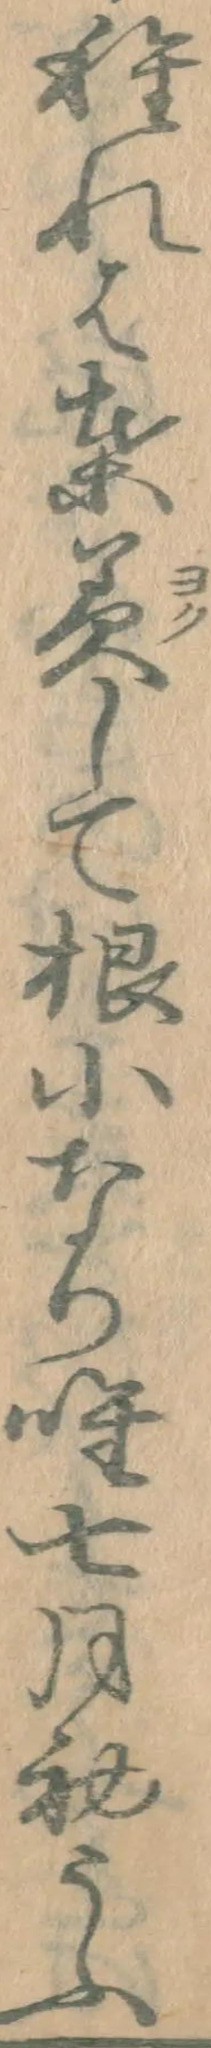種れは葉美して根小なり唯七月初うふ
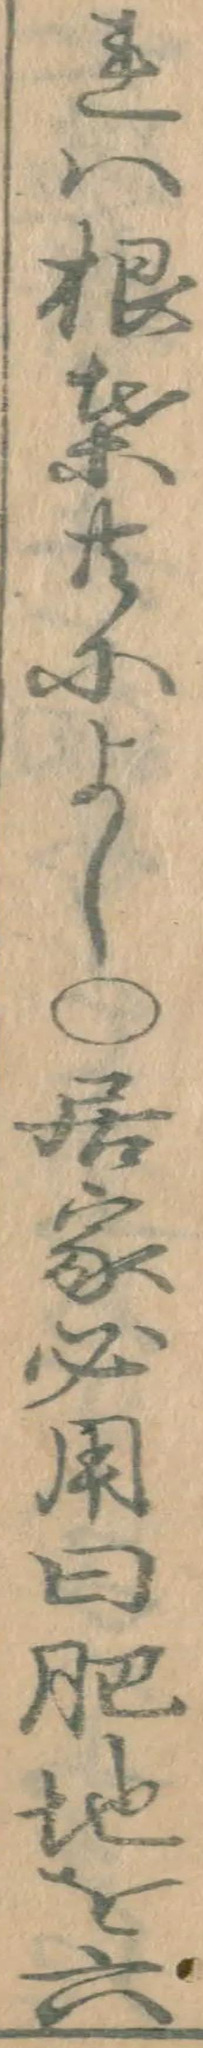れは根葉共によし〇居家必用曰肥地を六

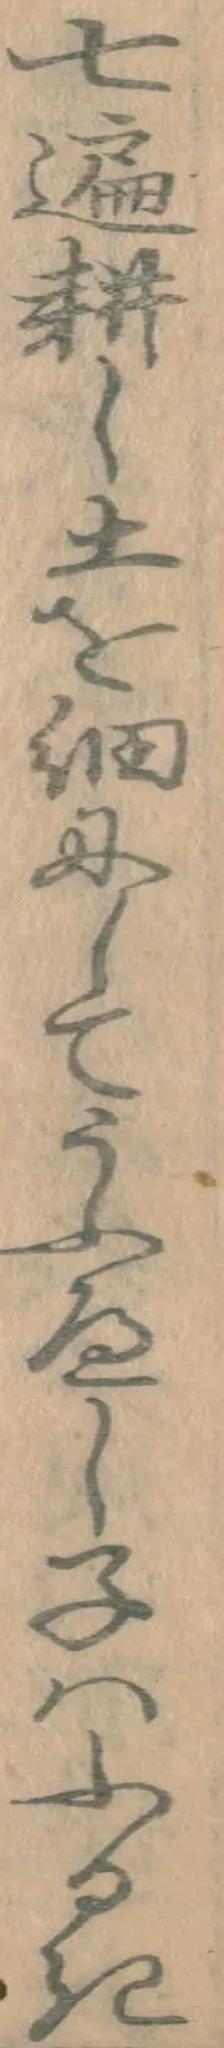七遍耕し土を細にしてうふへし子はふるき
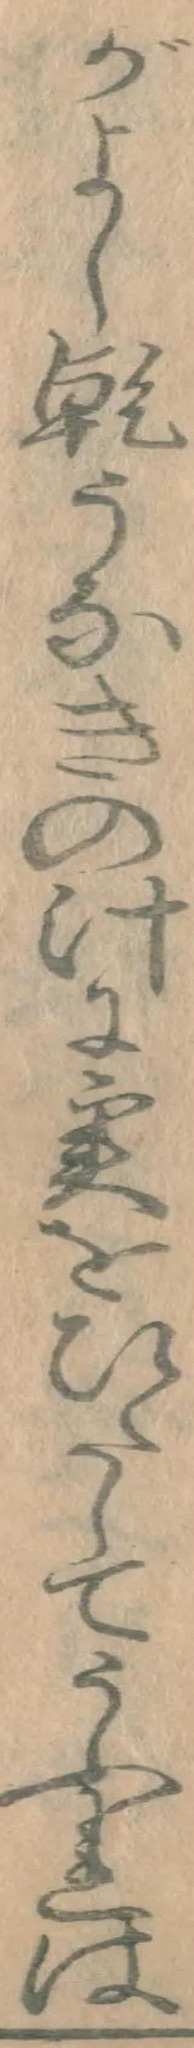がよし乾うなきの汁に実をひたしてうふれは
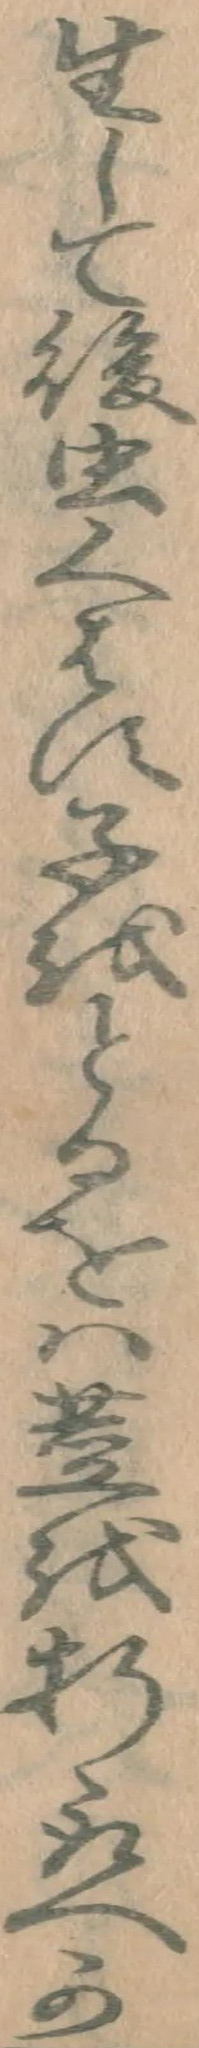生して後虫くはす子をとるをは茎を折取へか
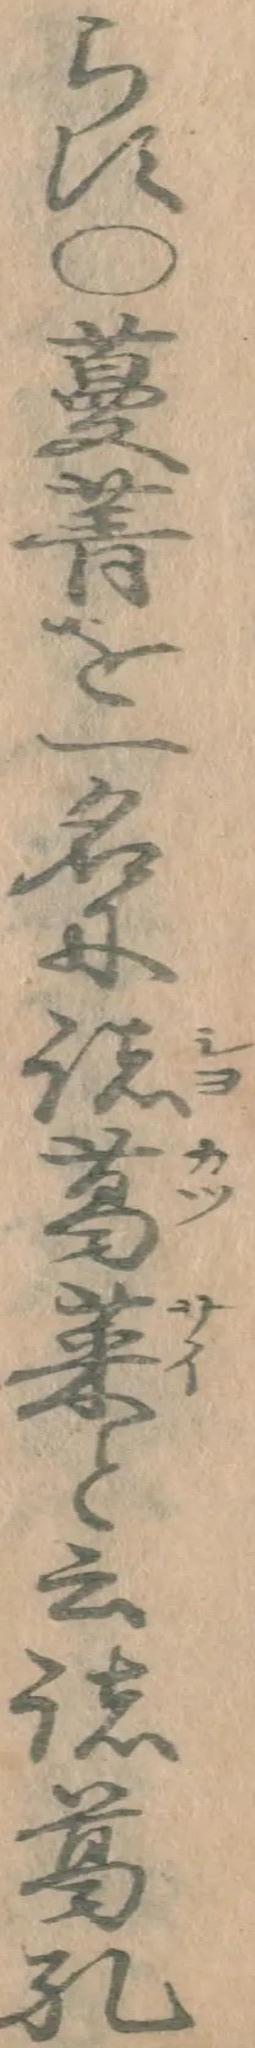らす〇蔓菁を一名に諸葛菜と云諸葛孔
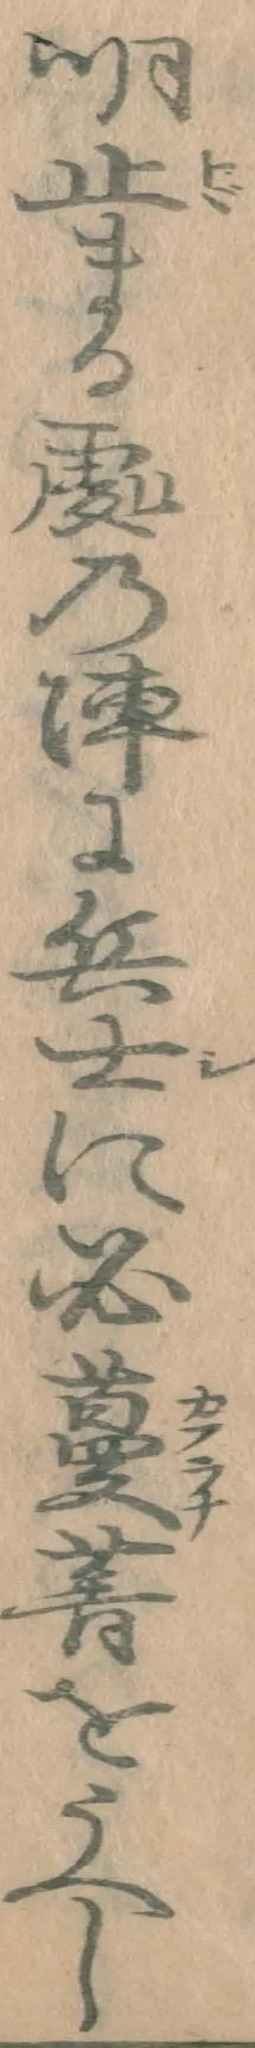明止まる処の陣に兵士に必蔓菁をうへし
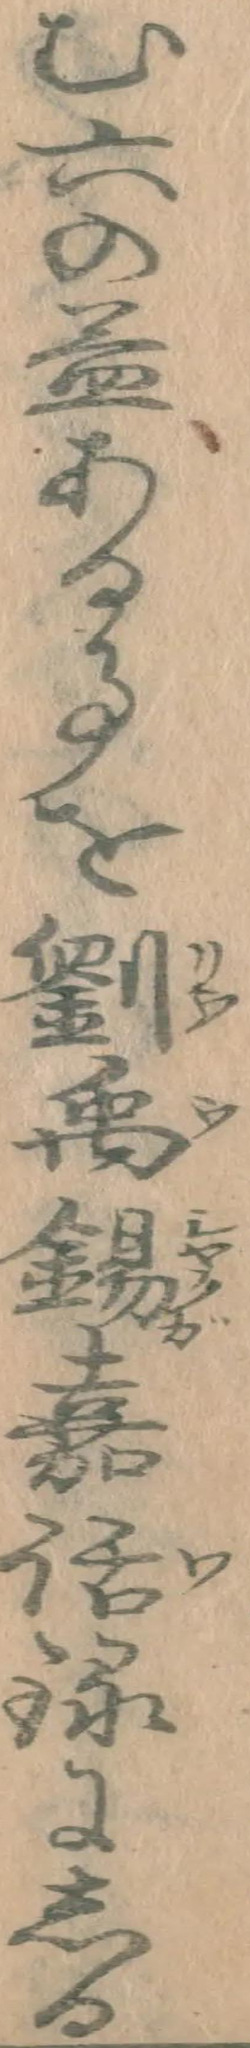む六の益ある事を劉禹錫嘉話録にしる
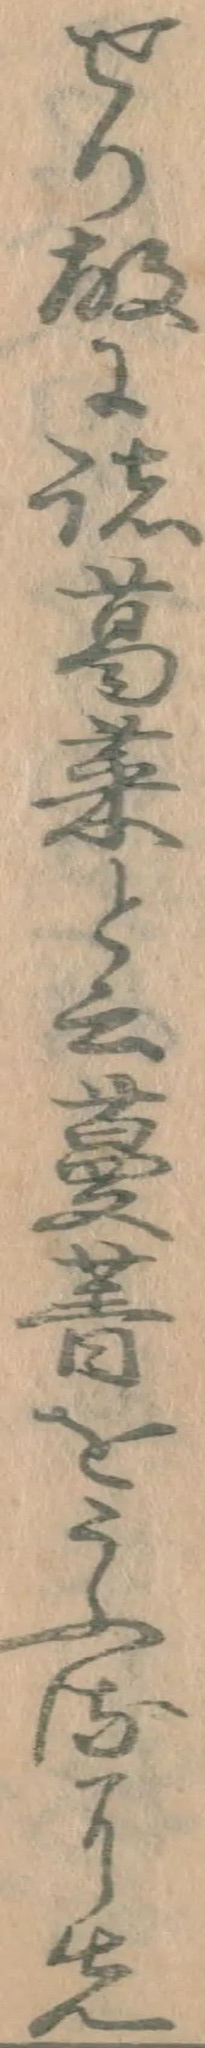せり故に諸葛菜と云蔓菁をうふるに先
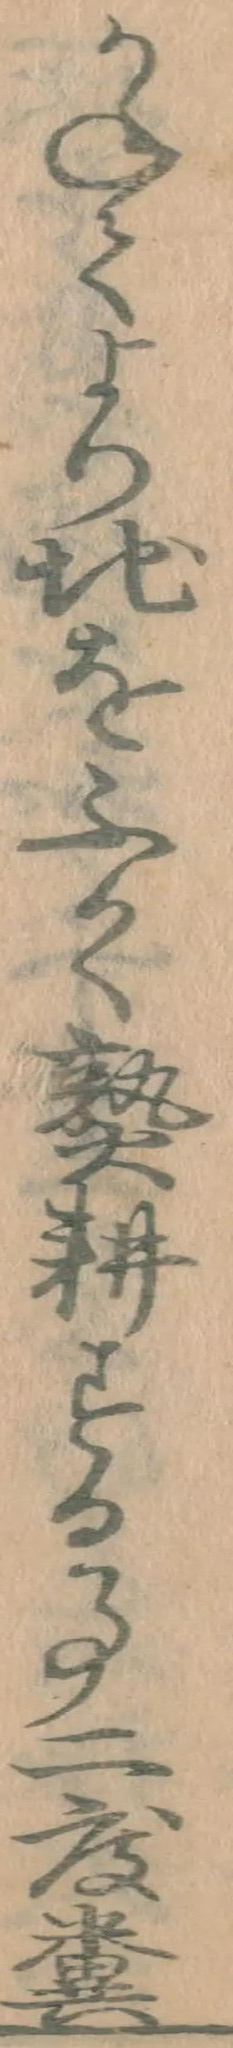かねてより地をふかく熟耕する事二度糞
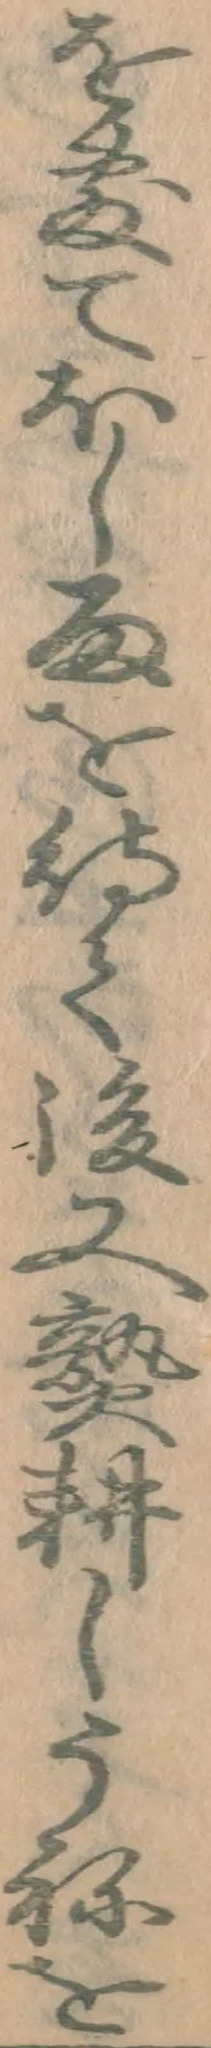を敷てほし雨を待て後又熟耕しうねを
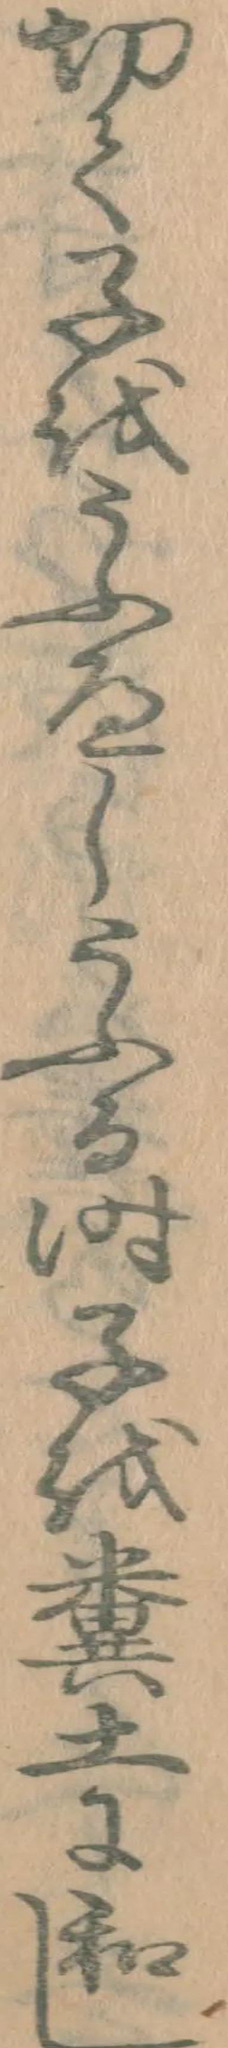切て子をうふるへしうふる時子を糞土に和し
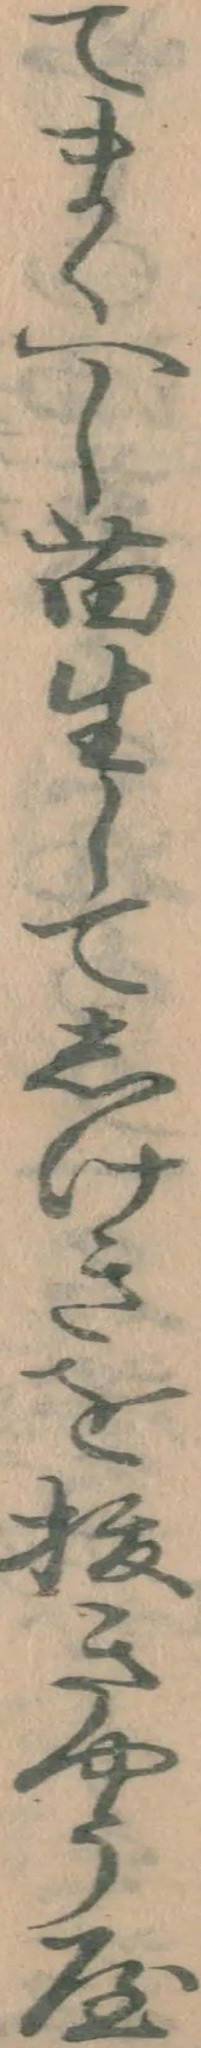てまくへし苗生してしけきを抜きやうや
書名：菜譜 3巻
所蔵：国立国会図書館 National Diet Library, JAPAN
